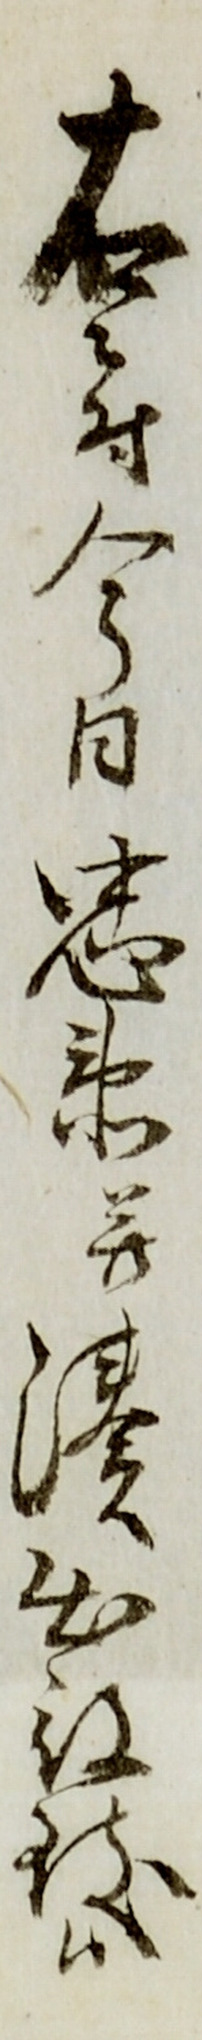右に付忠衛幷湊出役致候
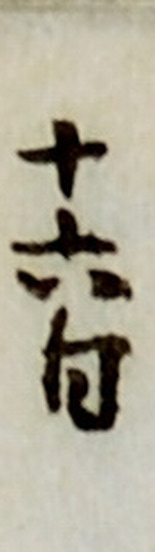十六日
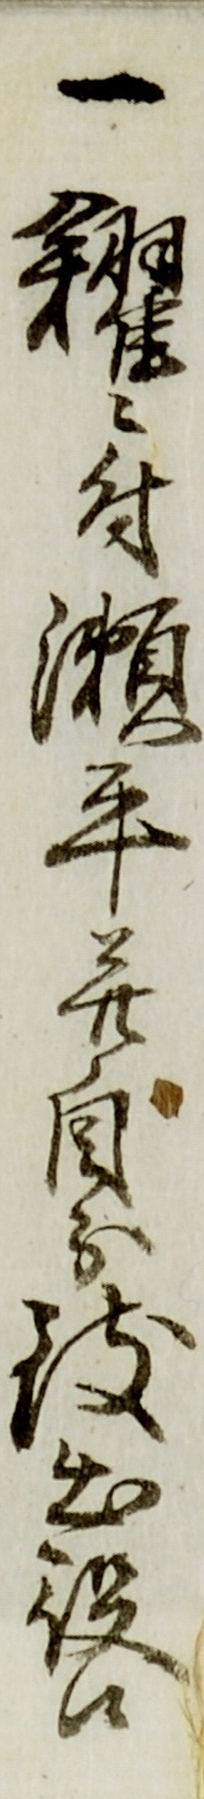一糴に付瀬平幷自分致出役候
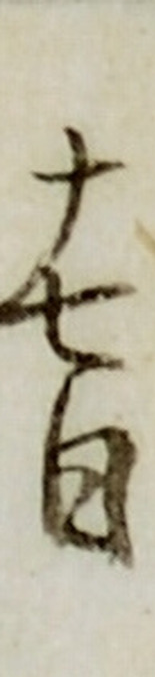十七日
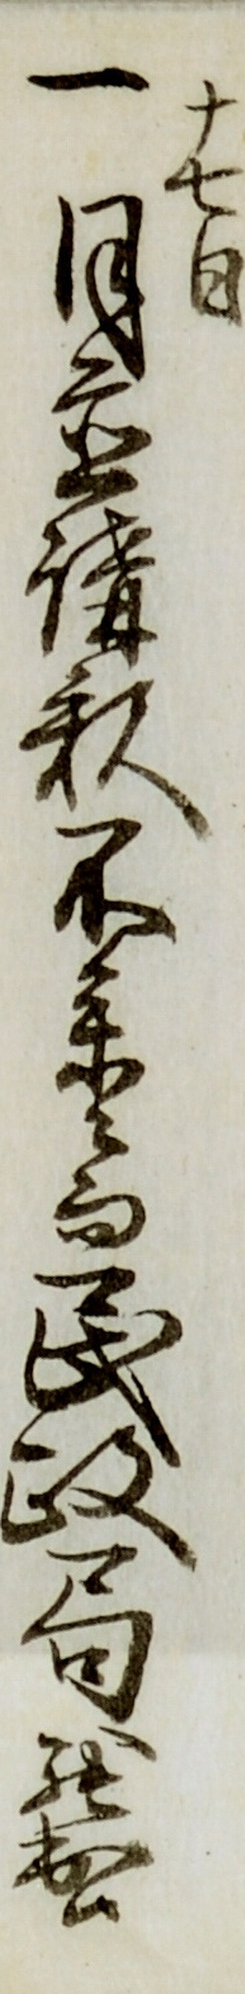一月並講釈不参にて民生局へ罷出候
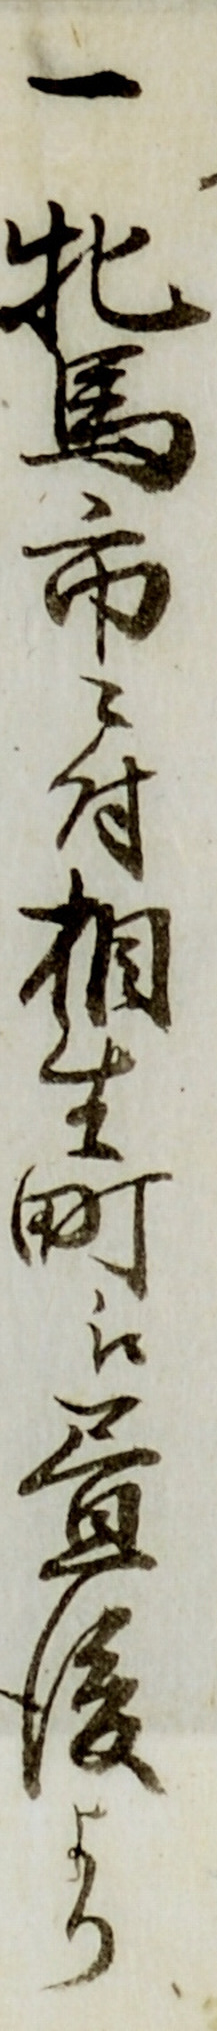一牝馬市に付相生町え昼後より
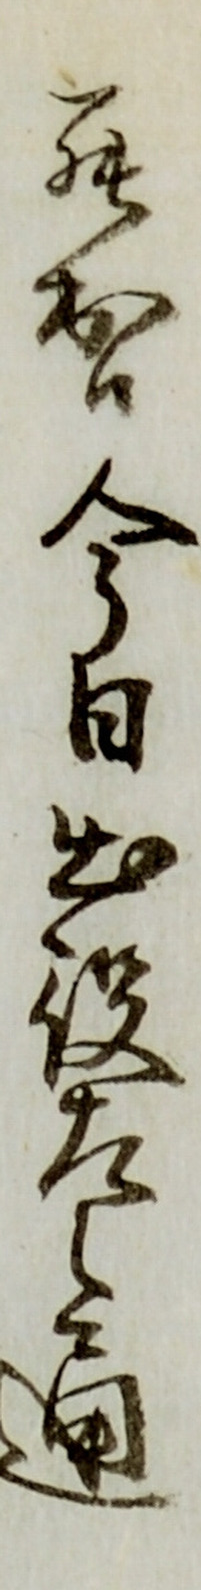罷出候今日出役左之通
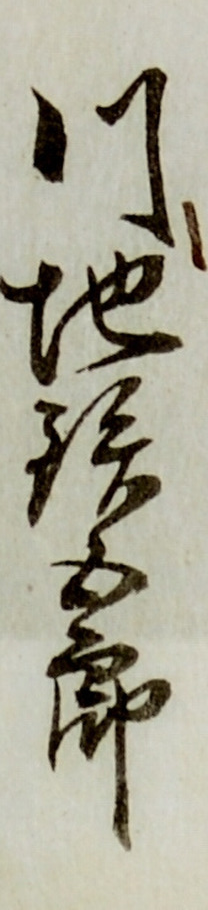川地鉄五郎

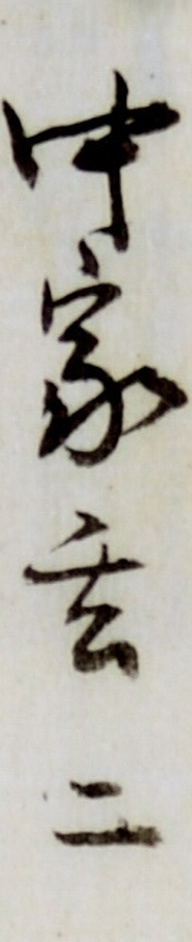中家玄二
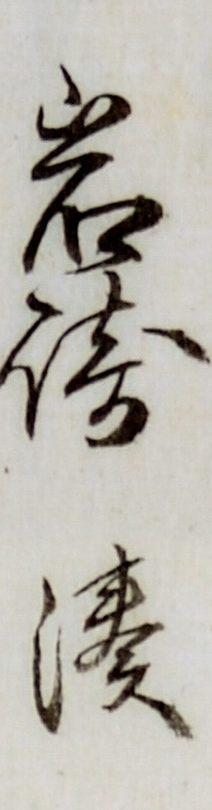岩崎湊
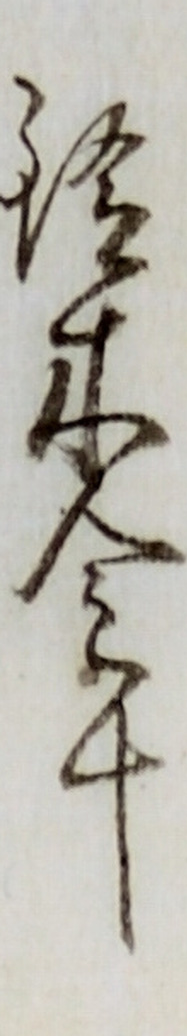鈴木金十
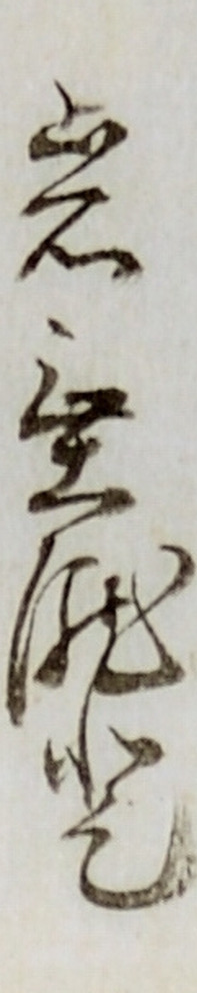岩垂滝登
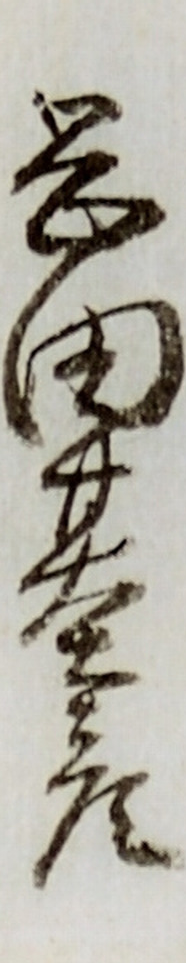岡田基彦
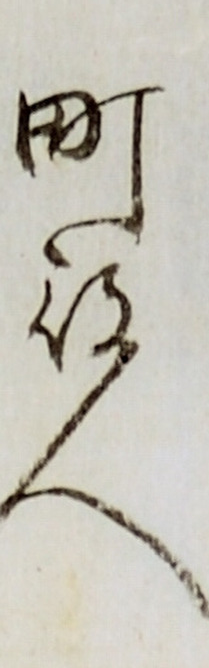町役人
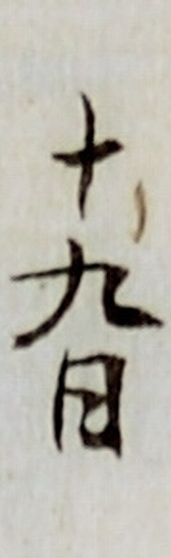十九日
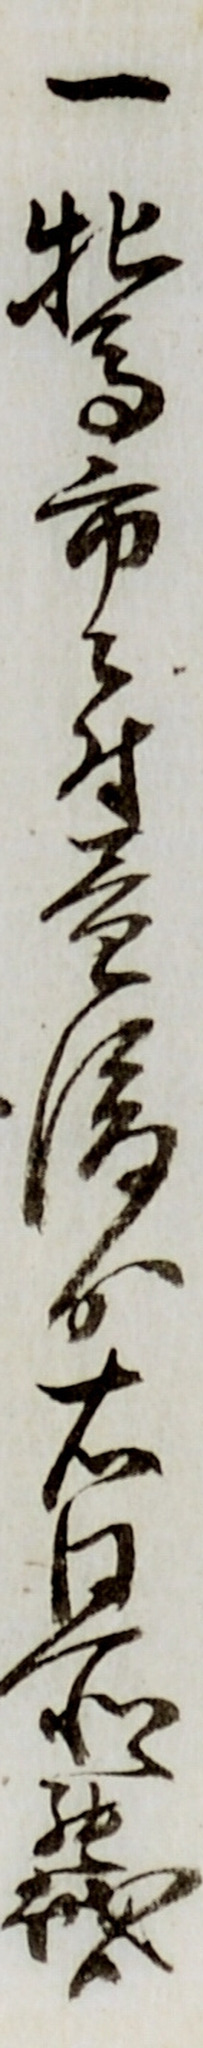一牝馬市に付昼後ゟ右同所へ罷越候
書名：山林方諸事御用留
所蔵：伊那市立高遠町図書館・合同会社AMANE
